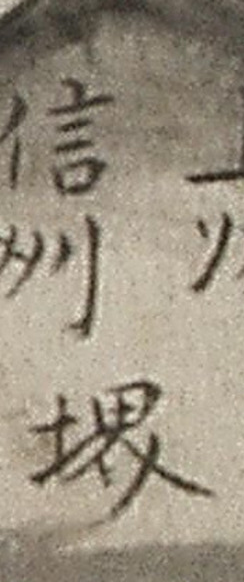信州堺
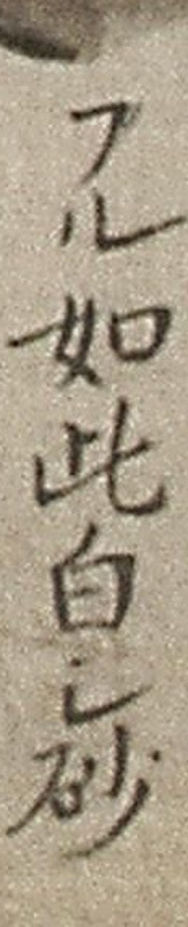フル如此白シ砂
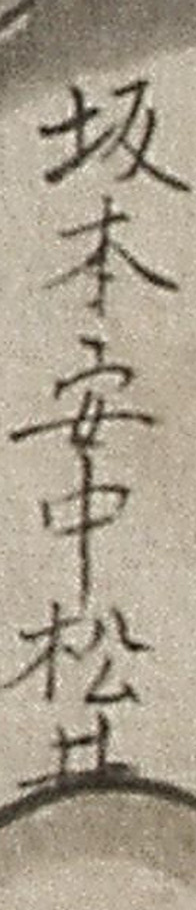坂本安中松井
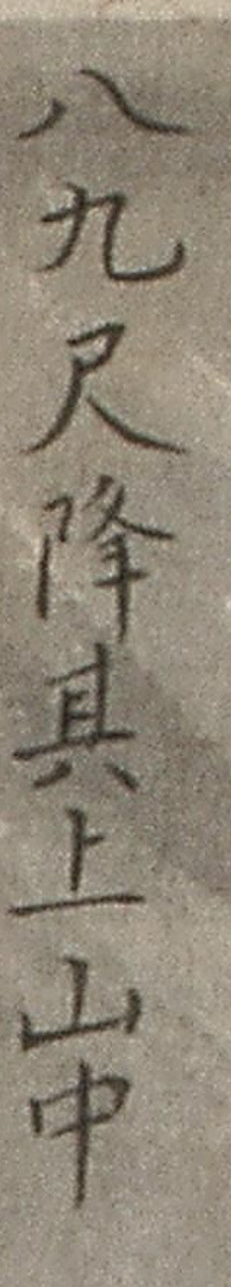八九尺降其上山中
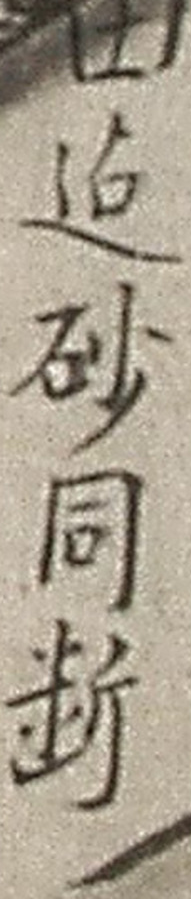田迄砂同断
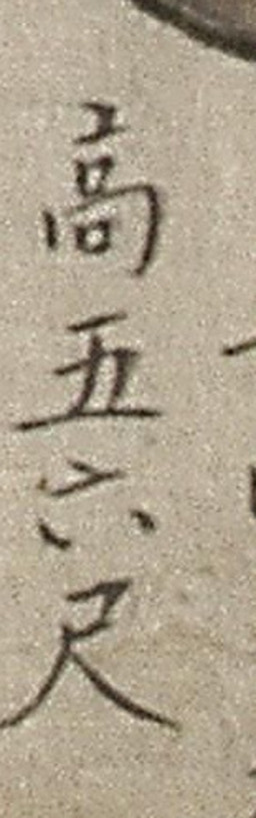高五六尺
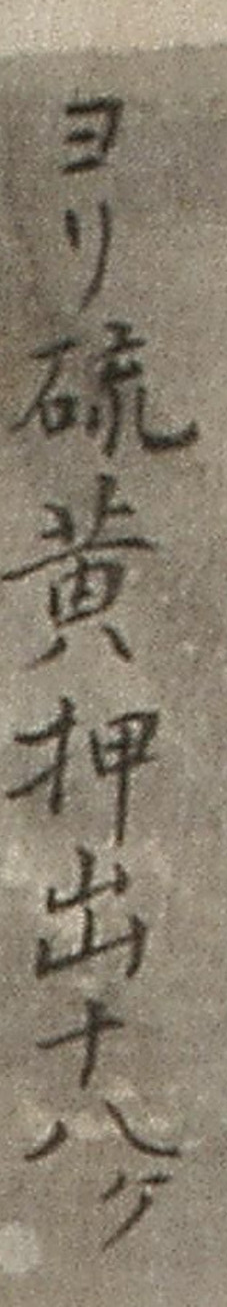ヨリ硫黄押出十八ヶ
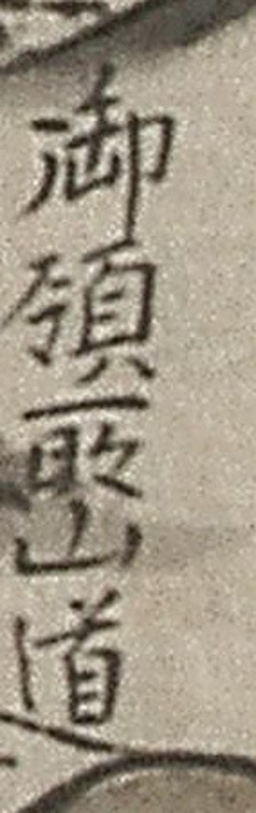御領所山道
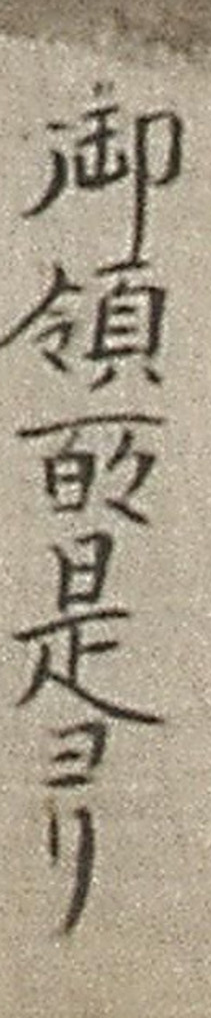御領所是ヨリ
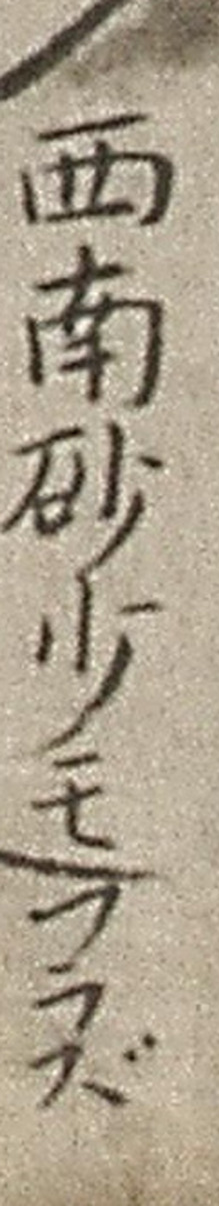西南砂少モフラズ
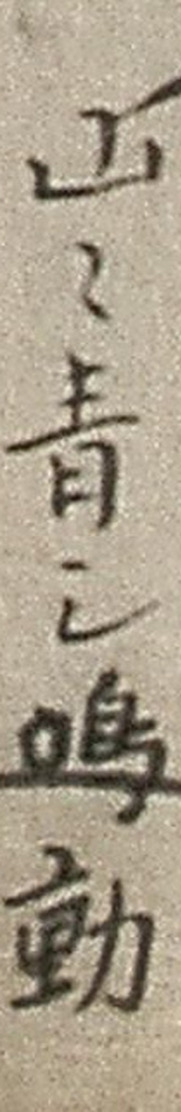山々青シ鳴動
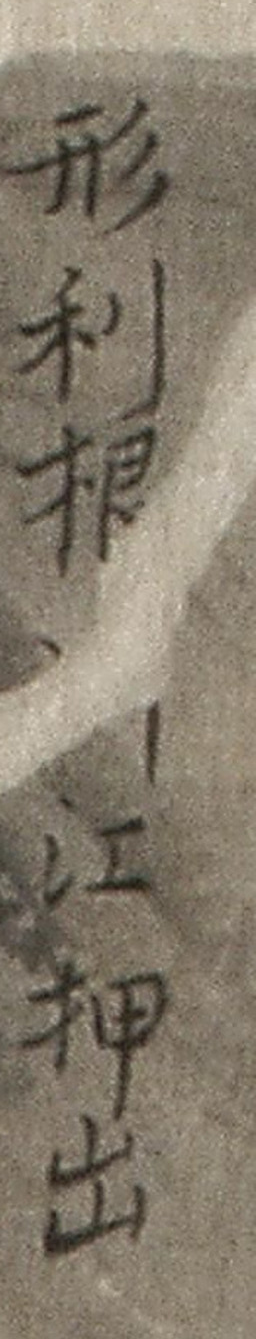形利根川江押出
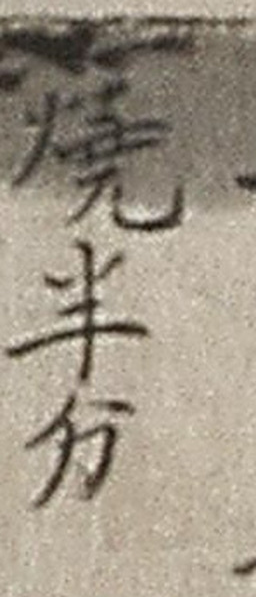焼半分
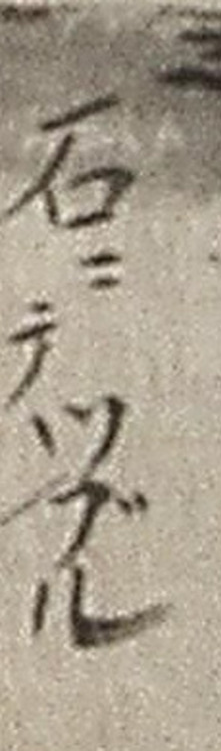石二テツブㇽ
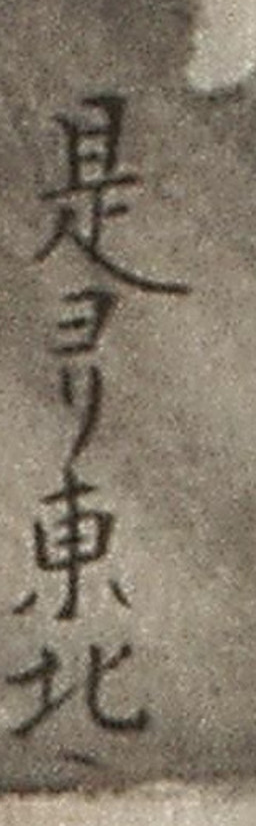是ヨリ東北へ
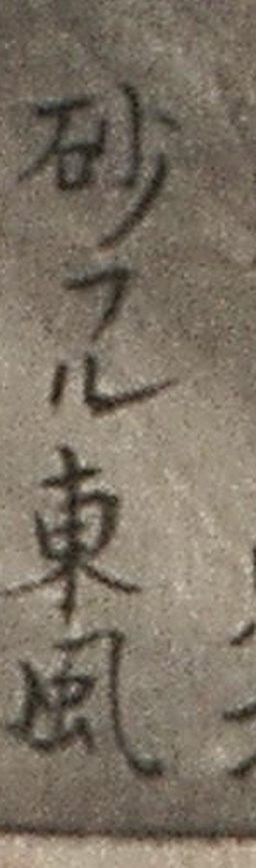砂フル東風
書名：太平秘録抜書　浅間山燒及普賢山崩
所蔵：東京大学地震研究所図書室 Earthquake Research Institute Library, The University of Tokyo, JAPAN
